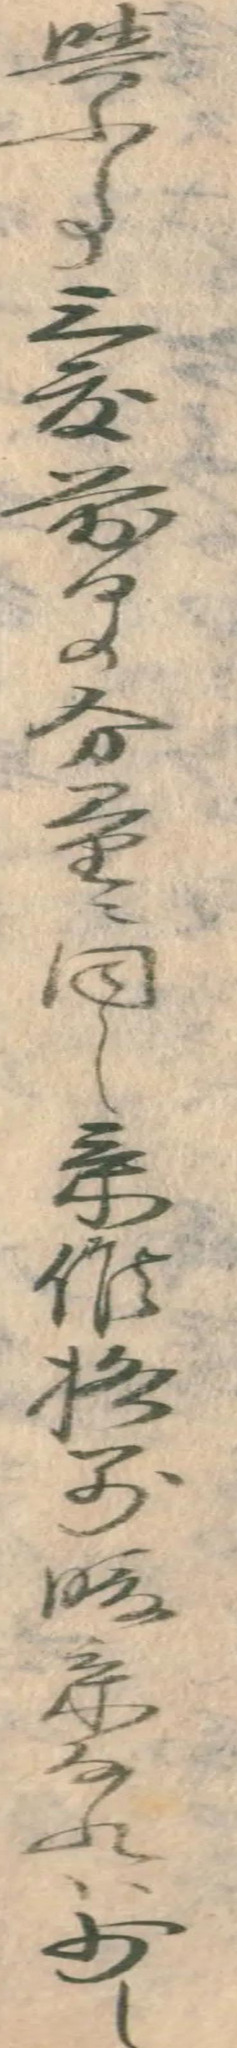与ふ事三度前日の分量ニ同し気候格別暖気なれハ少し
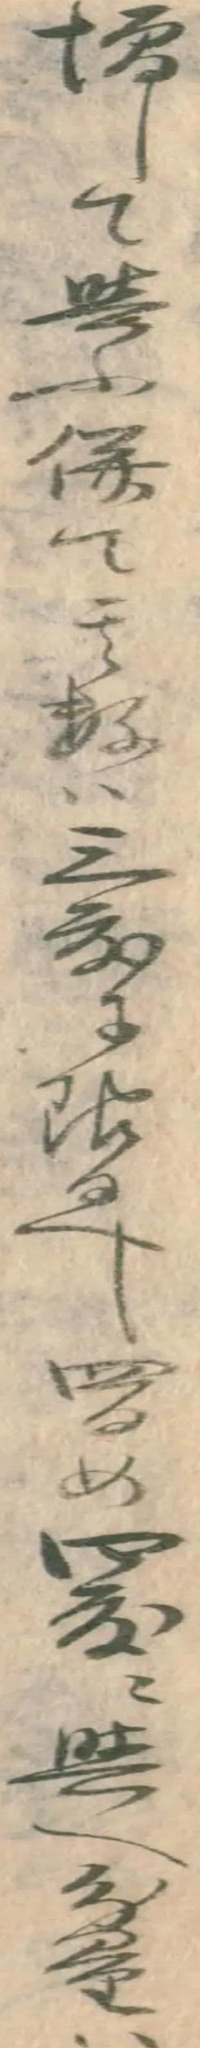増して与ふ併て其数ハ三度に限るへし四日め四度に与へ分量ハ

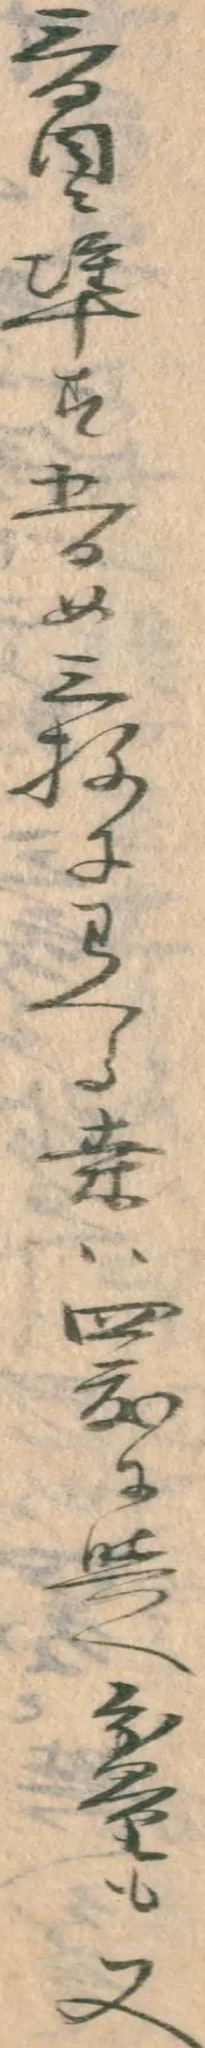三日目に準す五日め三枚にわくる桑は四度に与へ分量も又
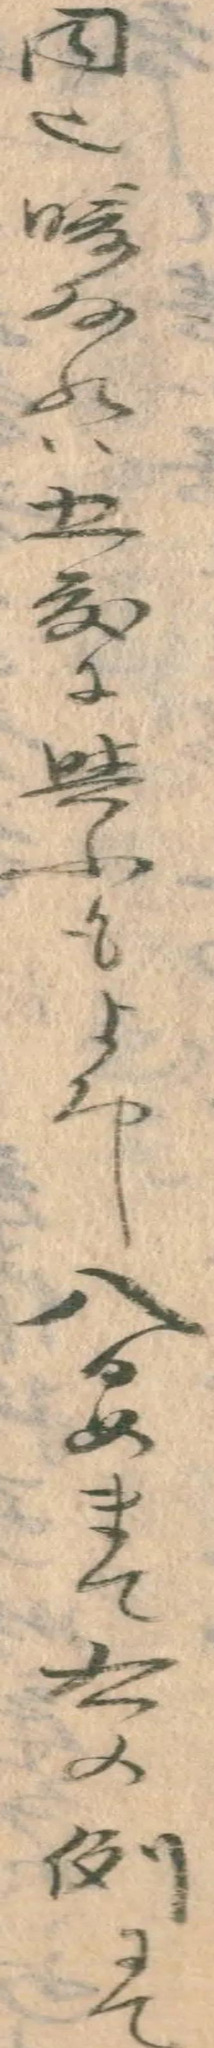同也暖なれは五度に与ふもよろし八日めまて右の例にて
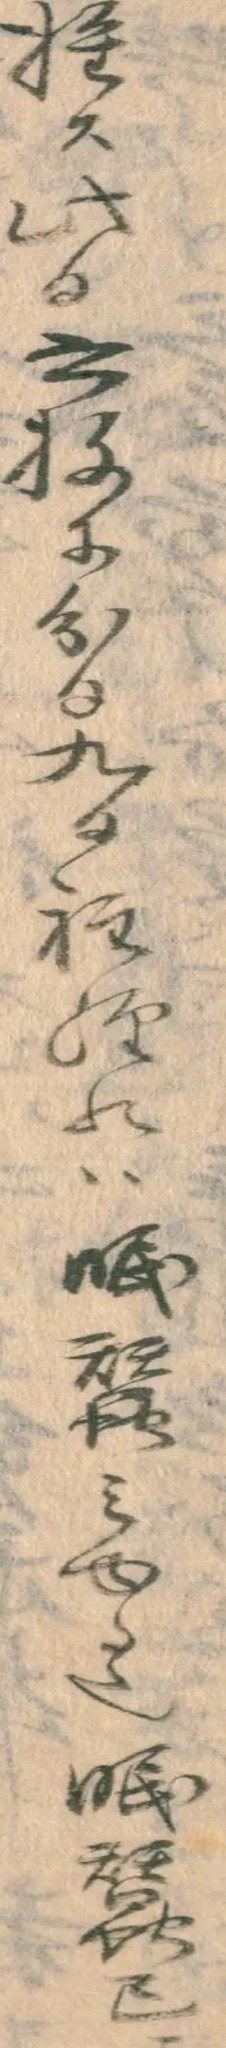推ス此日六枚に分る九日程経れハ眠蚕みゆる也眠蚕已ニ
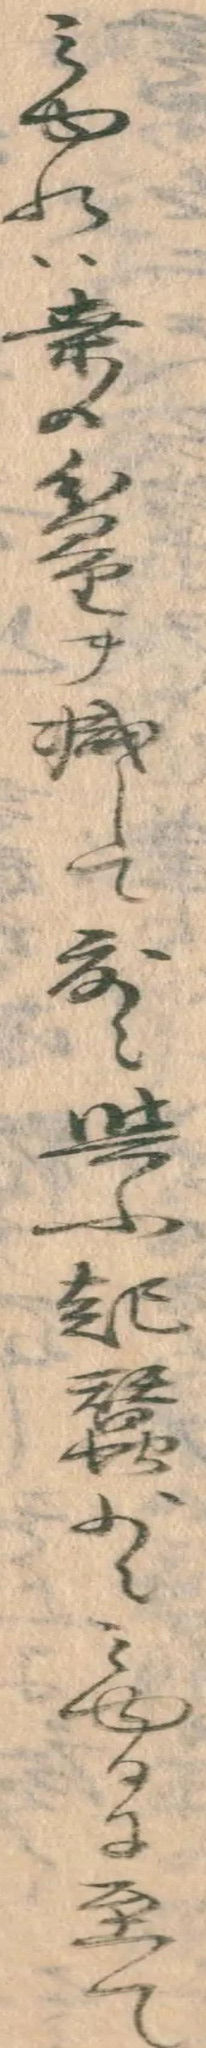ミゆれハ桑の分量ヲ減して度々与ふ起蚕少々みゆるに至て
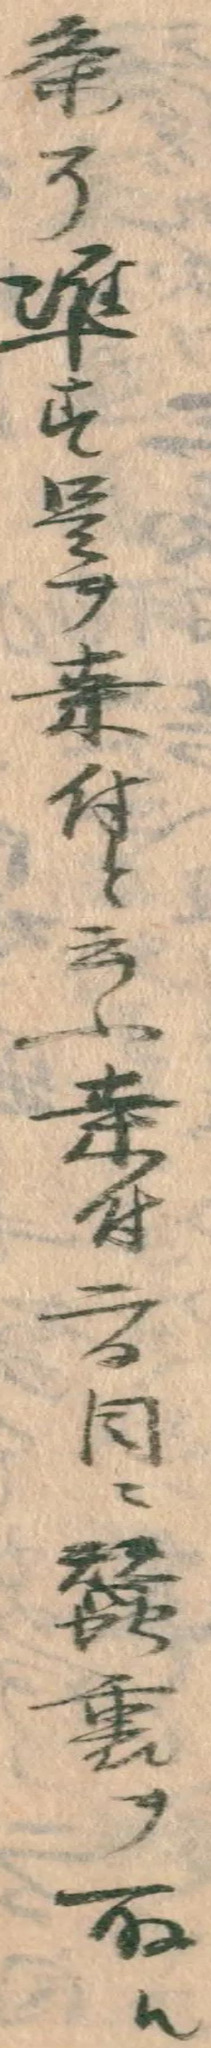条に準す是ヲ桑付と云ふ桑付二日目ニ蚕裏ヲ取ル
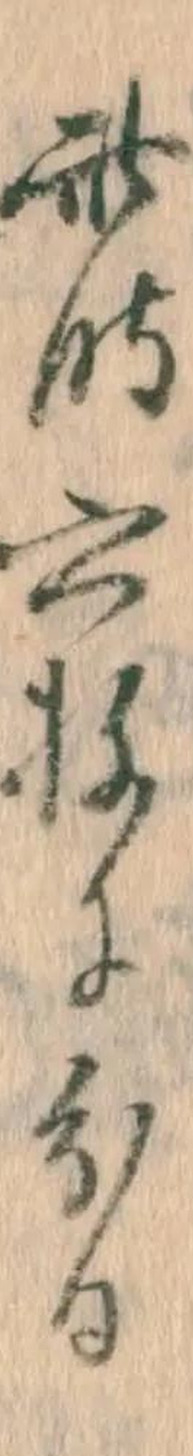此時六枚に分る
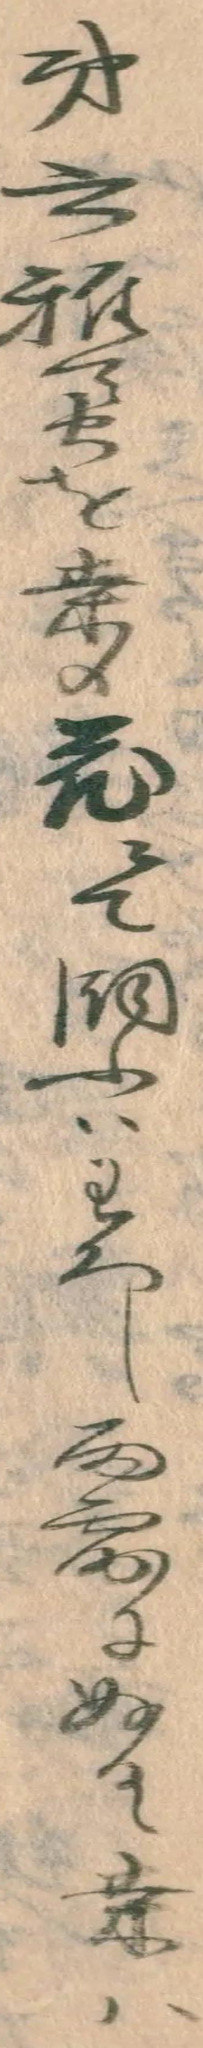第六稚蚕を桑の花にて飼ふはわろし雨露にぬるゝ桑は
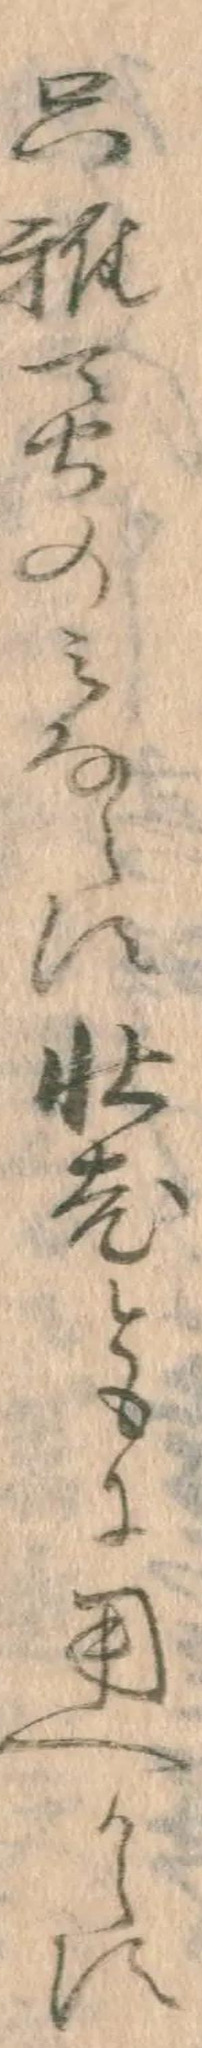只稚蚕のみならす壮老ともに用へからす
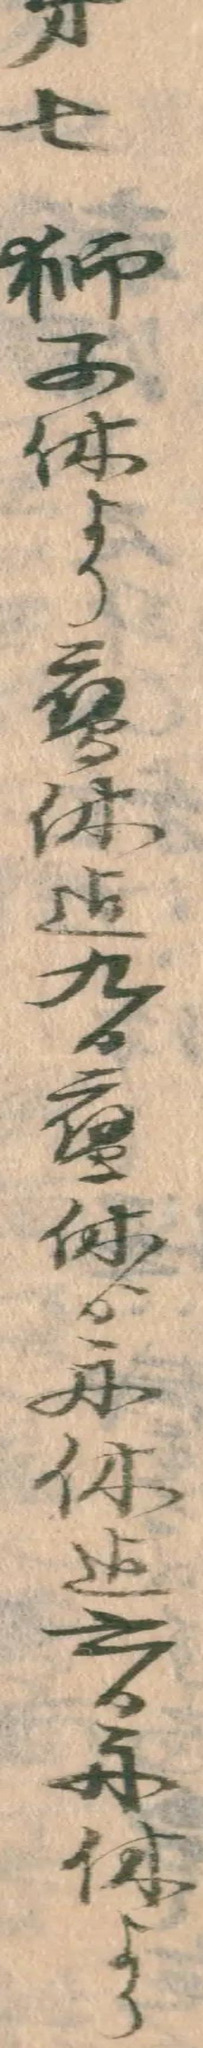第七獅子休より鷹休迄九日鷹休ゟ舟休迄六日舟休より
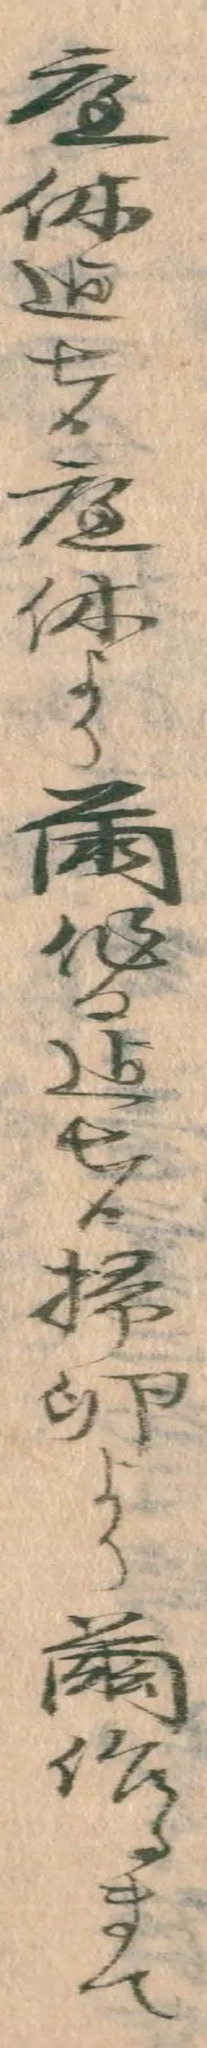庭休迄七日庭休より爾作る迄七日掃卵より繭作るまて
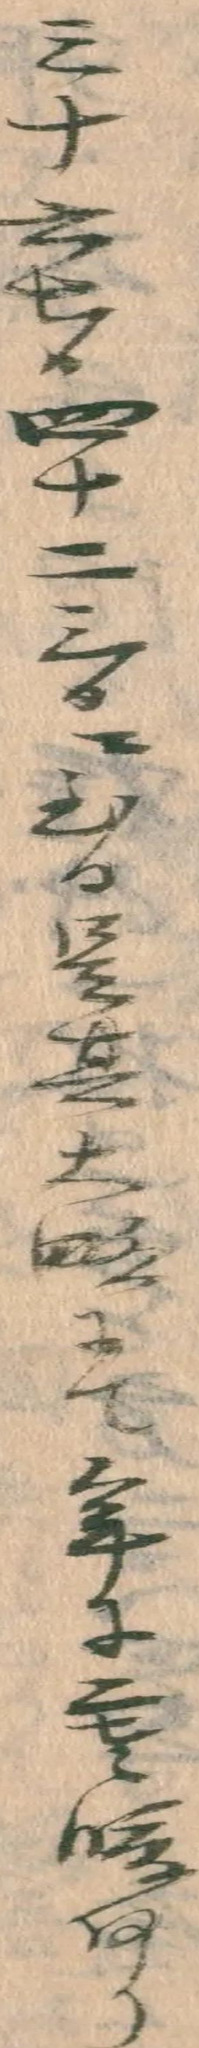三十六七日四十二三日に至る是其大略にて年に寒暖あり
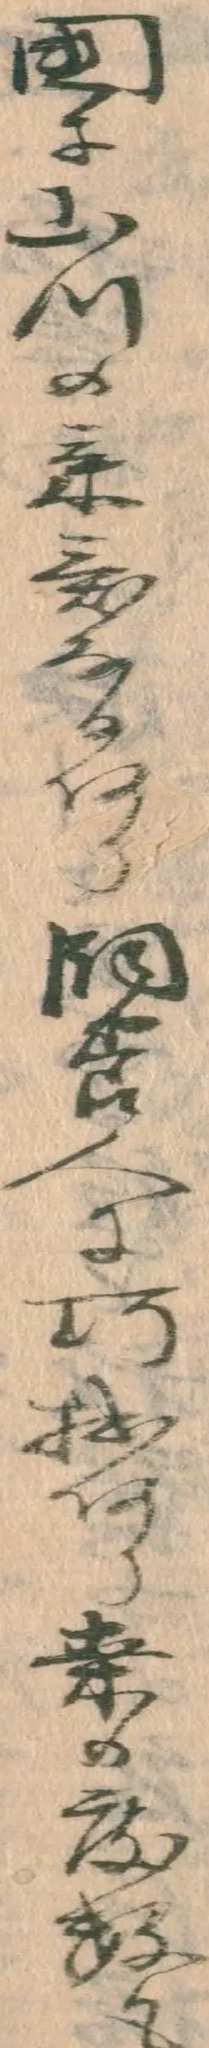国に山川の気異なるあり飼養人に巧拙あり桑の度数も
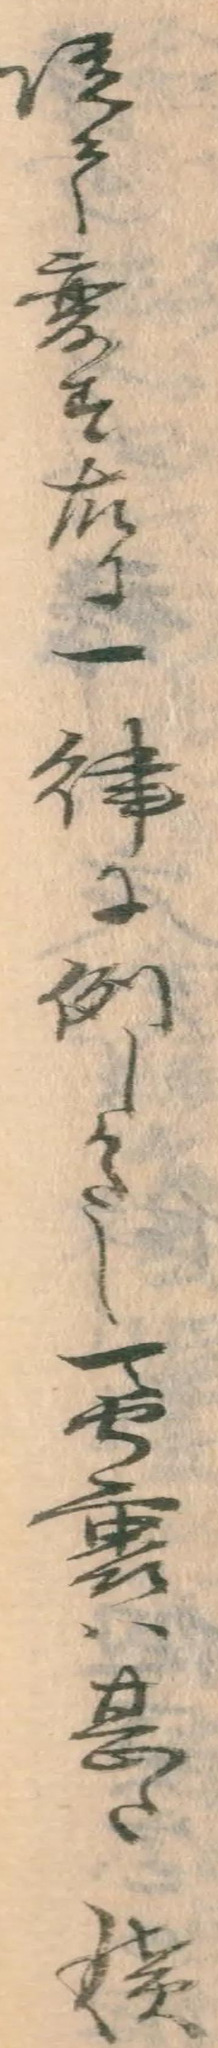随て変す故に一律に例しかたし蚕裏ハ甚た積
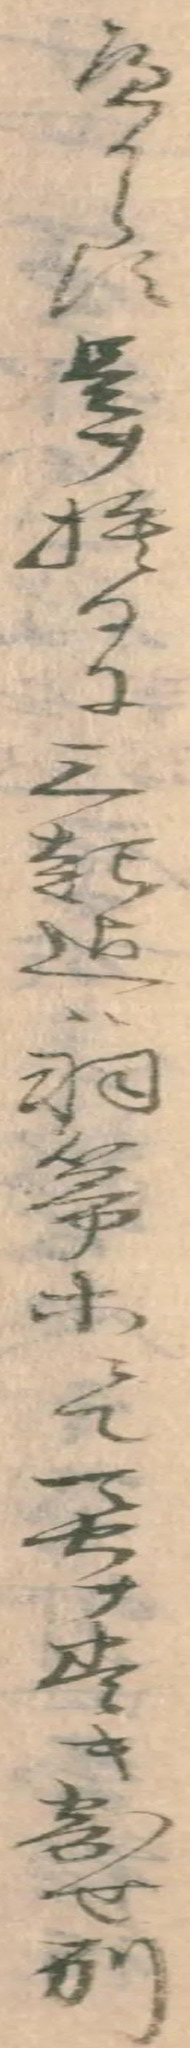へからす是ヲ捨るに三起迄ハ羽箒等ニて蚕ヲ巻き寄せ別
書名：蚕桑集成
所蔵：国立国会図書館 National Diet Library, JAPAN
